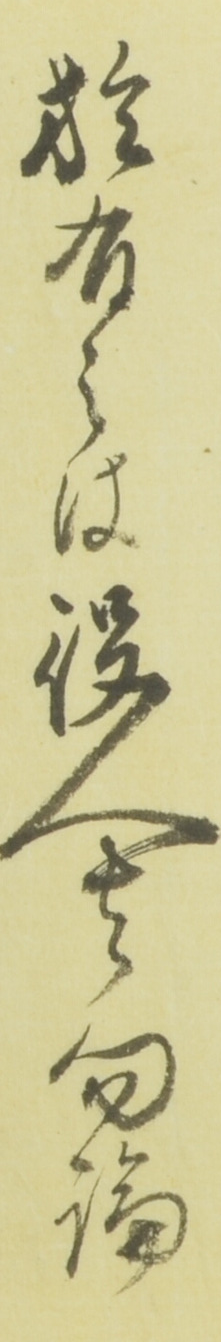於有之は役人は勿論
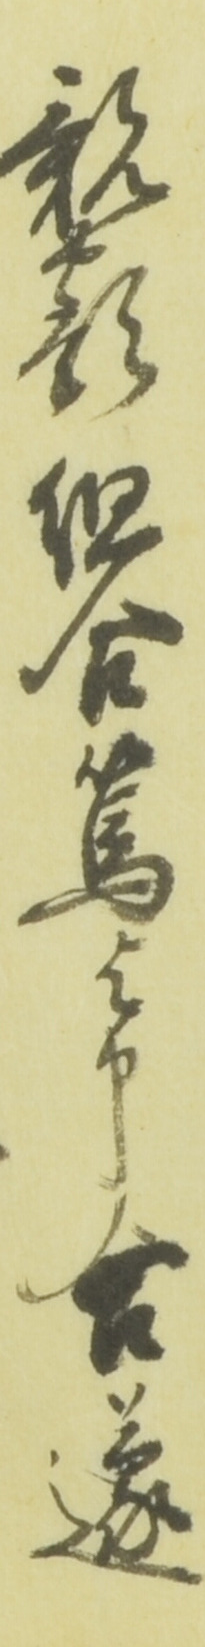親類組合篤と申含遂
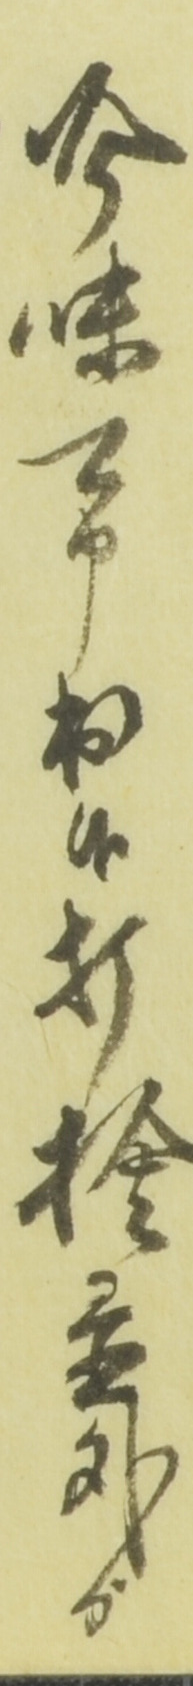吟味可申出候打捨置外ゟ
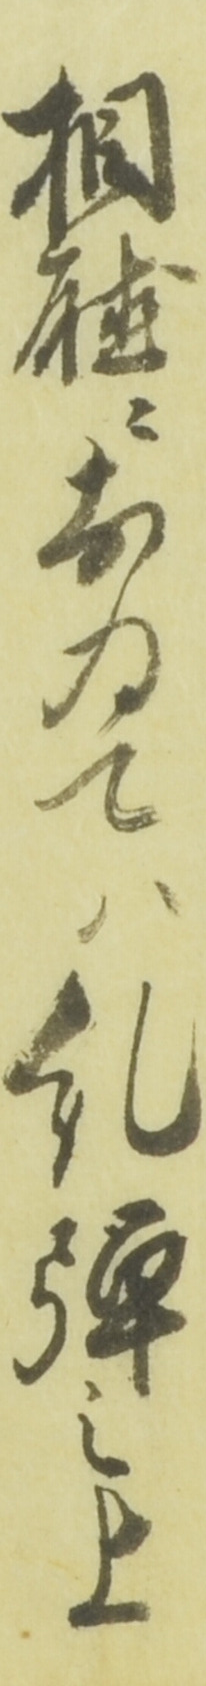相聴ニおゐてハ糺弾之上
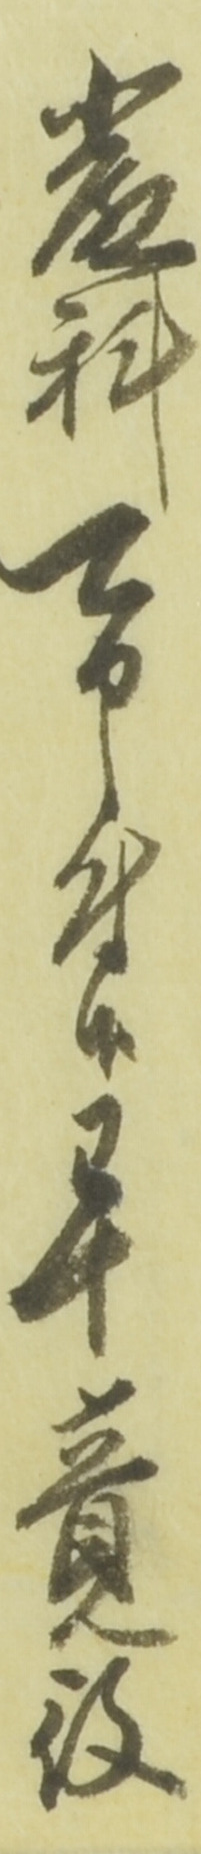厳科可申付候畢竟役
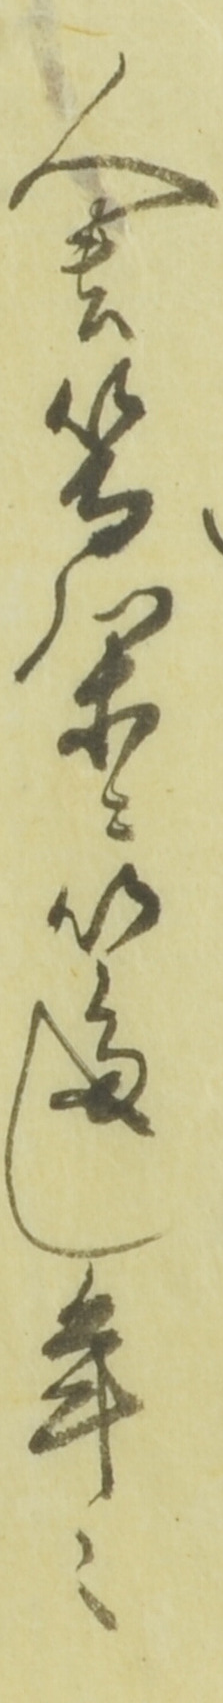人共等閑ニいたし年々
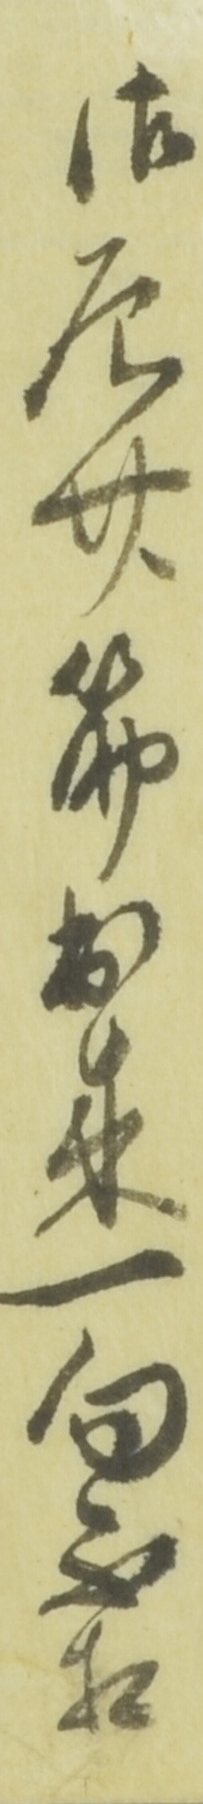御厄介筋出来一向不相
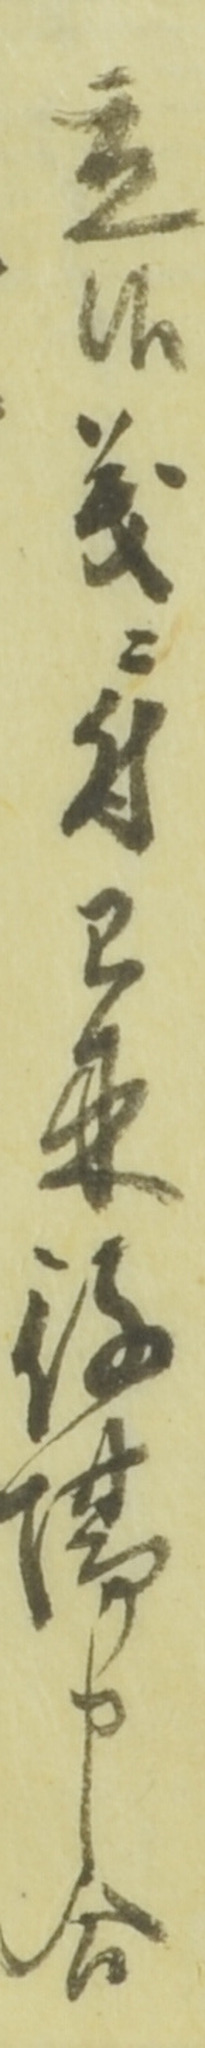立候義ニ付已来役場申合
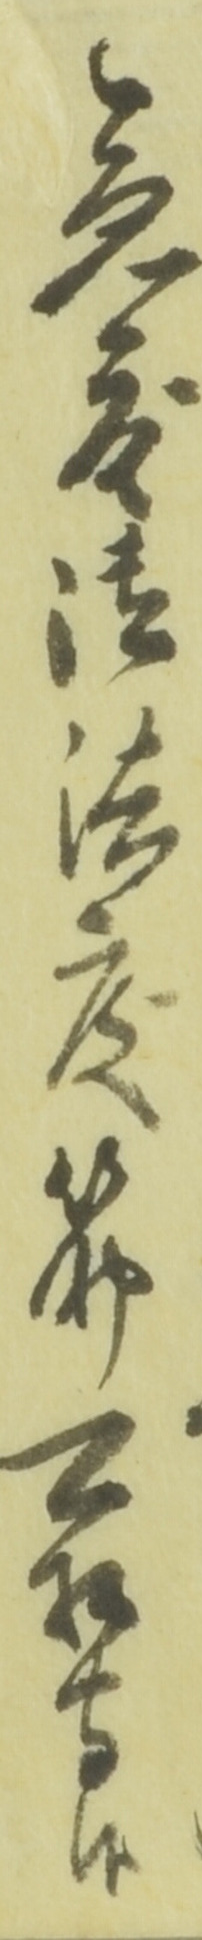急度御法度筋可相守候
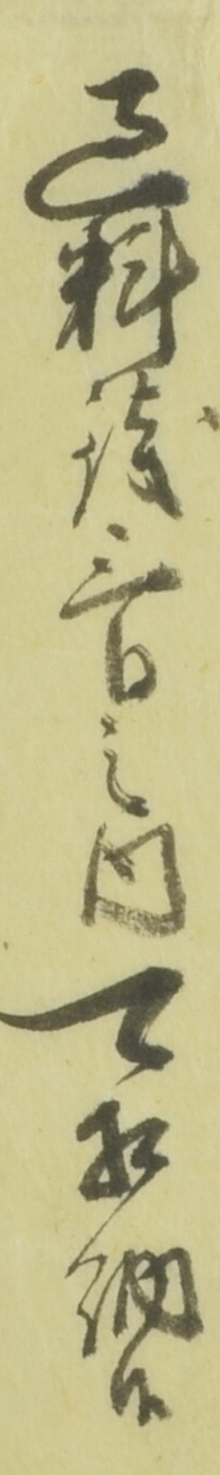過料銭三分之内可相納候
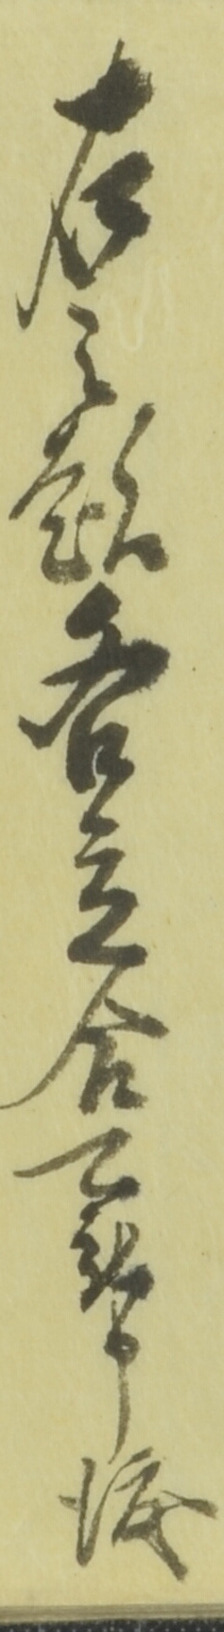右之趣各立合可被申渡
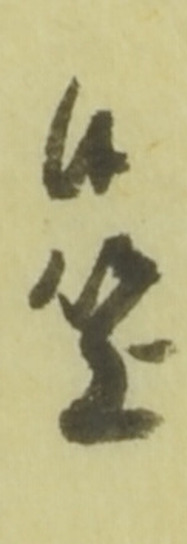候以上
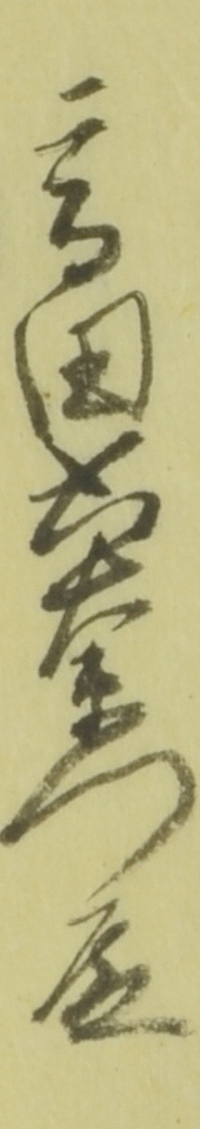高田六右衛門殿
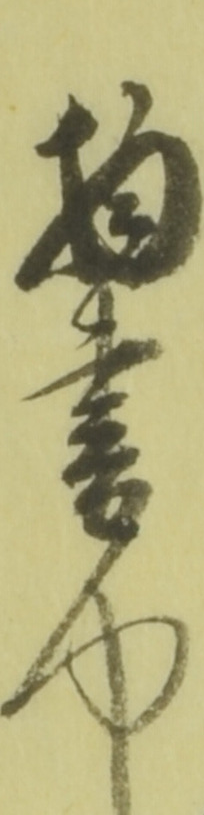物書中

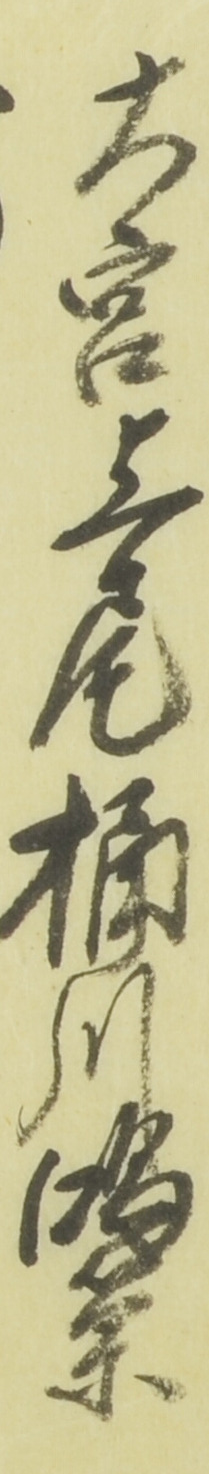大宮上尾桶川鴻巣
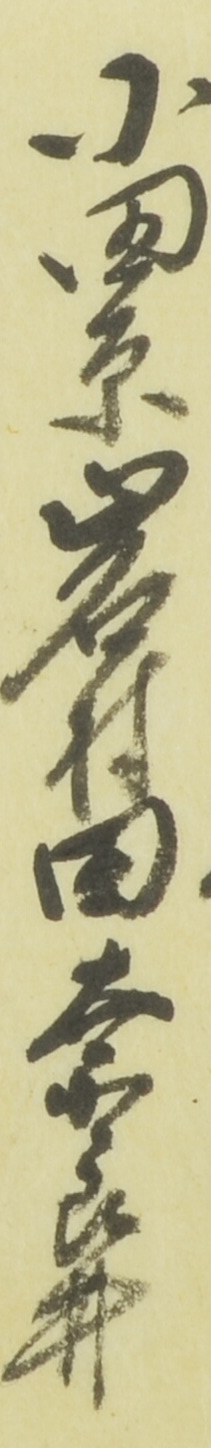小田原岩村田奈良井
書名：御触書御書附控
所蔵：伊那市立高遠町図書館・合同会社AMANE
